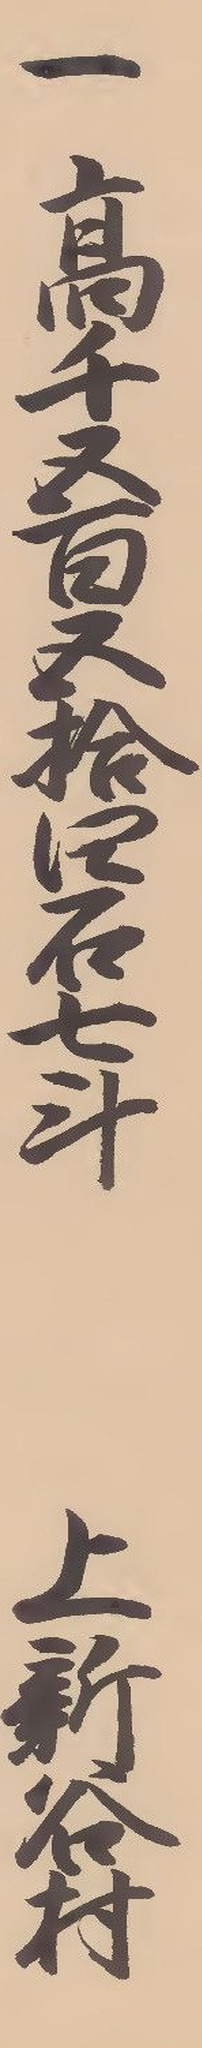一高千五百五拾四石七斗上新谷村
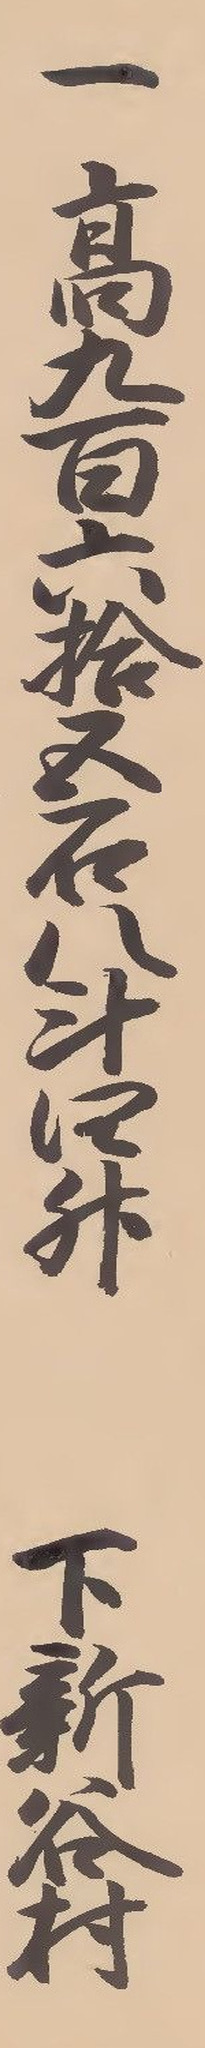一高九百六拾五石八斗四升下新谷村
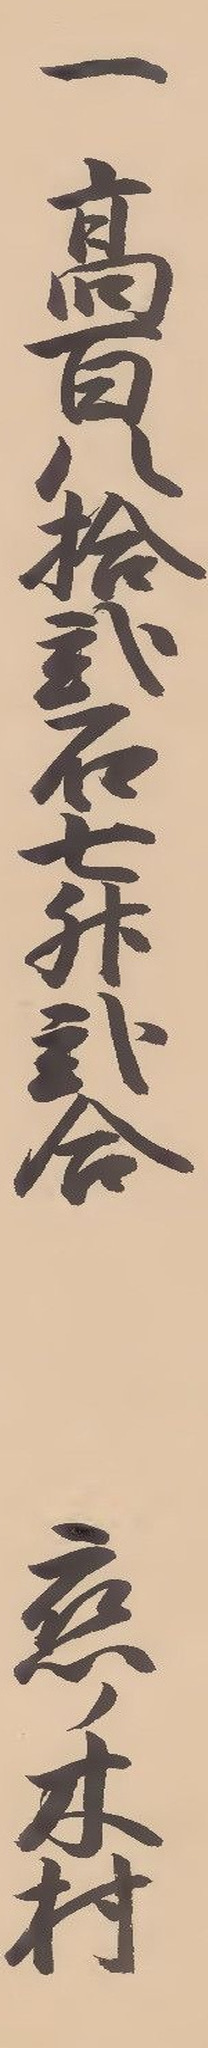一高百八拾弐石七升弐合恋ノ木村
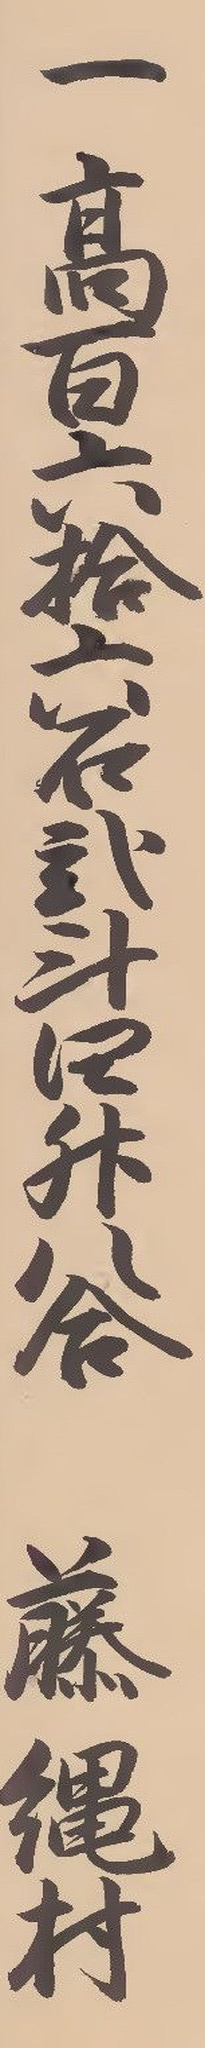一高百六拾六石弐斗四升八合藤縄村
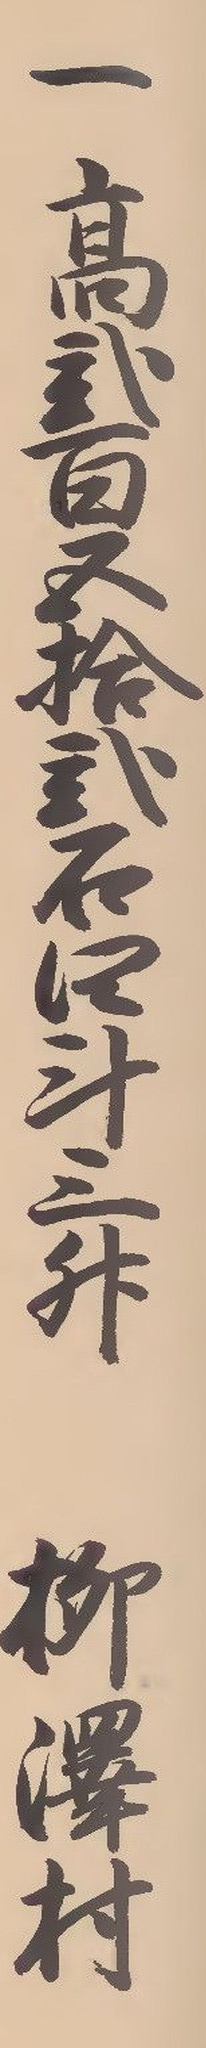一高弐百五拾弐石四斗三升柳沢村
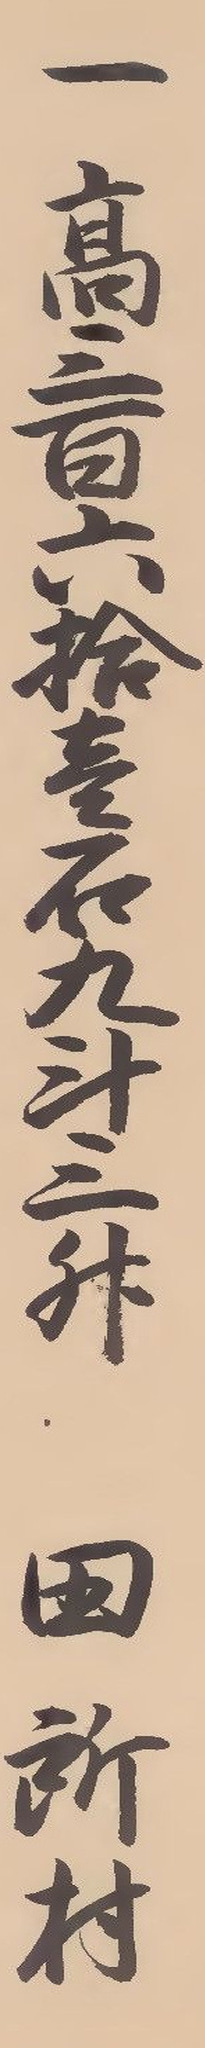一高三百六拾壱石九斗三升田所村
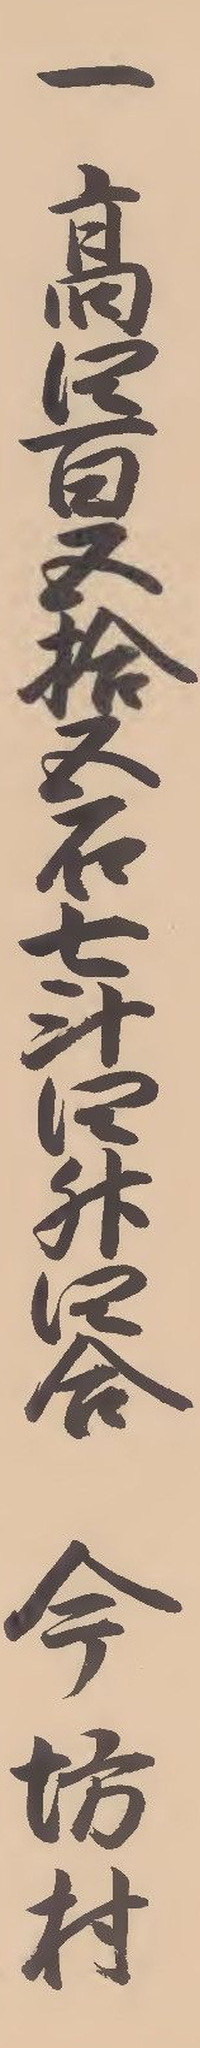一高四百五拾五石七斗四升四合今坊村
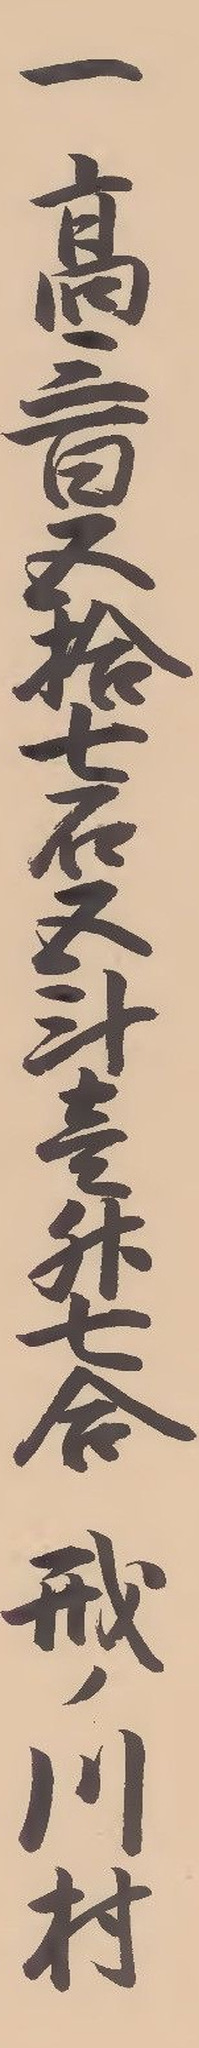一高三百五拾七石五斗壱升七合戒ノ川村

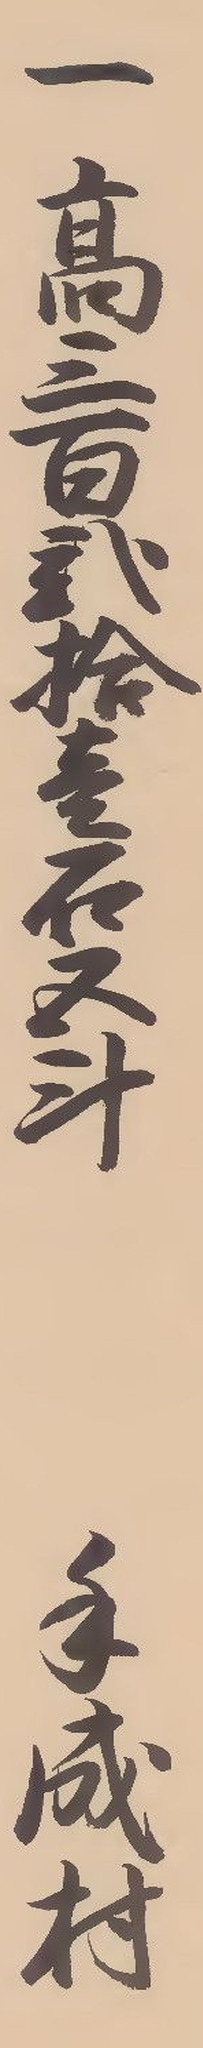一高三百弐拾壱石五斗手成村
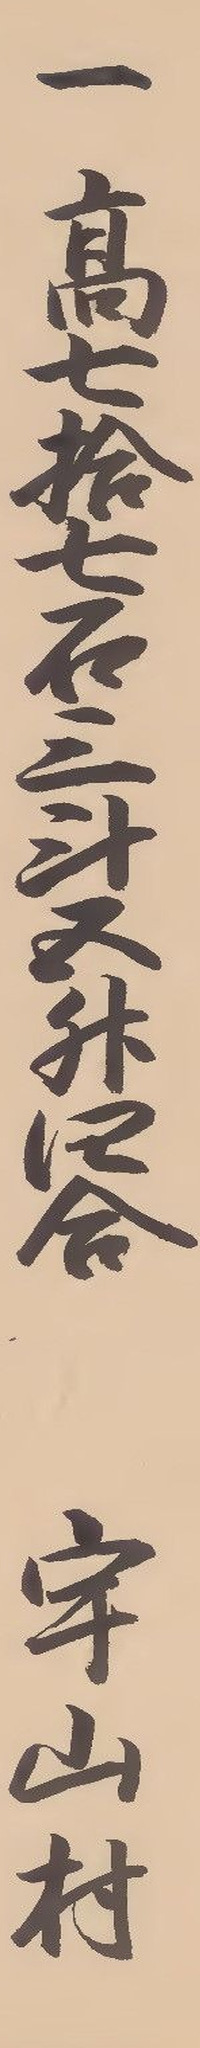一高七拾七石三斗五升四合宇山村
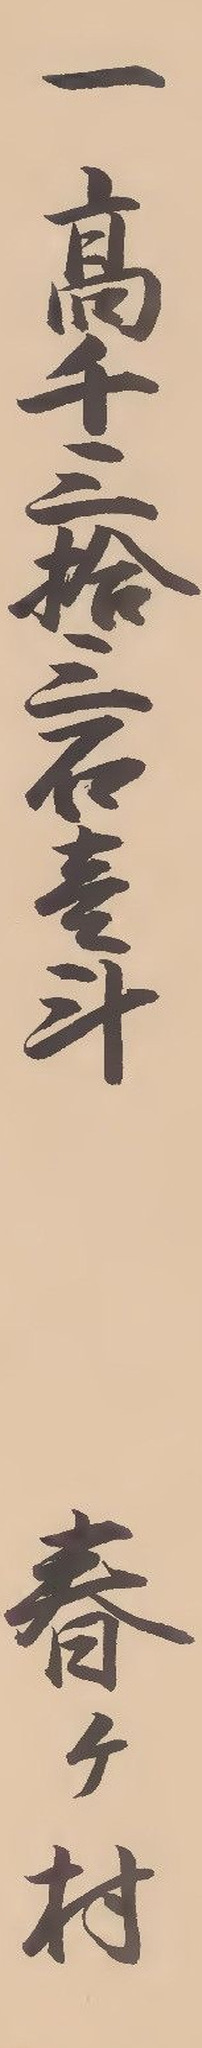一高千三拾三石壱斗春ヶ村
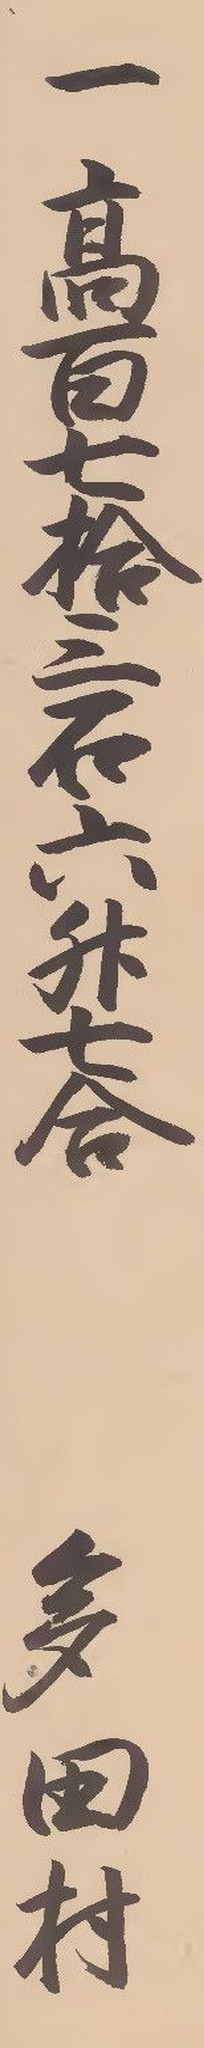一高百七拾三石六升七合多田村
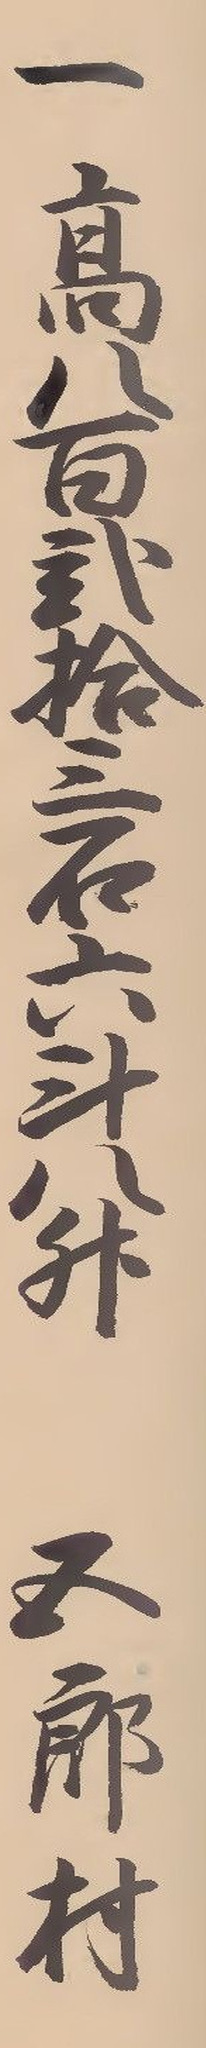一高八百弐拾三石六斗八升五郎村
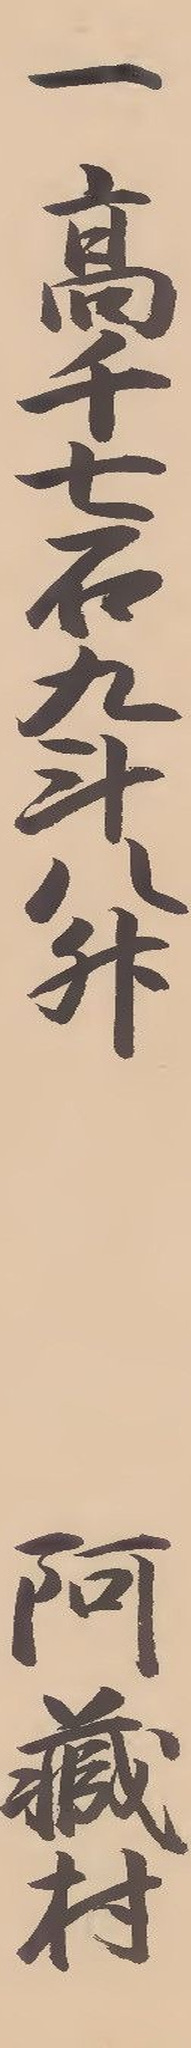一高千七石九斗八升阿蔵村
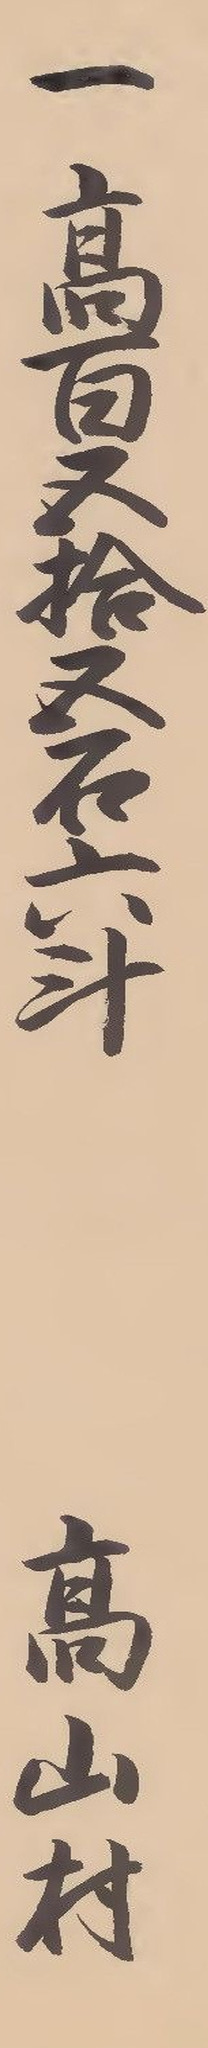一高百五拾五石六斗高山村
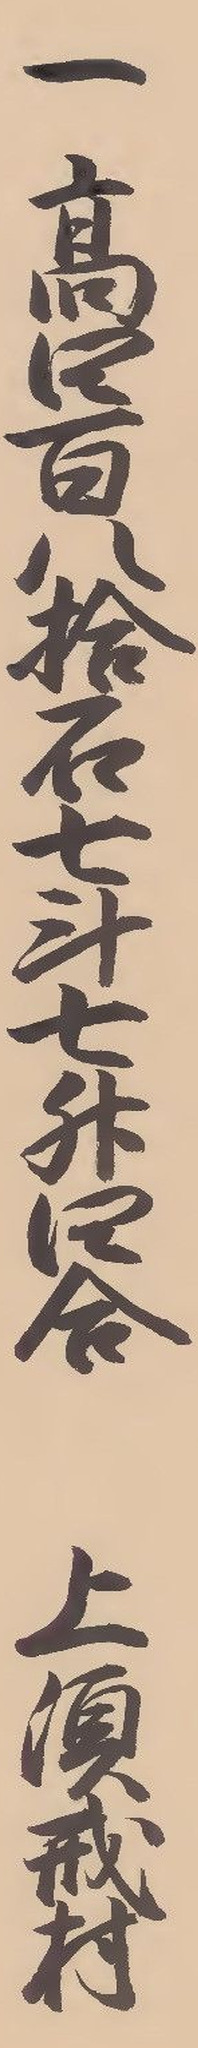一高四百八拾石七斗七升四合上須戒村
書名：伊予国郷帳
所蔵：国立公文書館 National Archives of Japan
